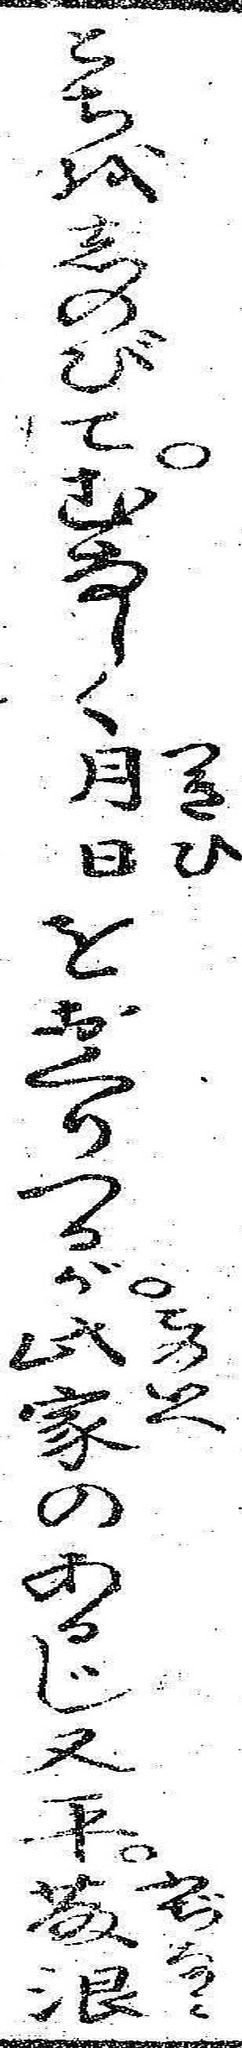こちをしのびて。むなしく月日をおくりつるが。此家のあるじ又平。藤浪
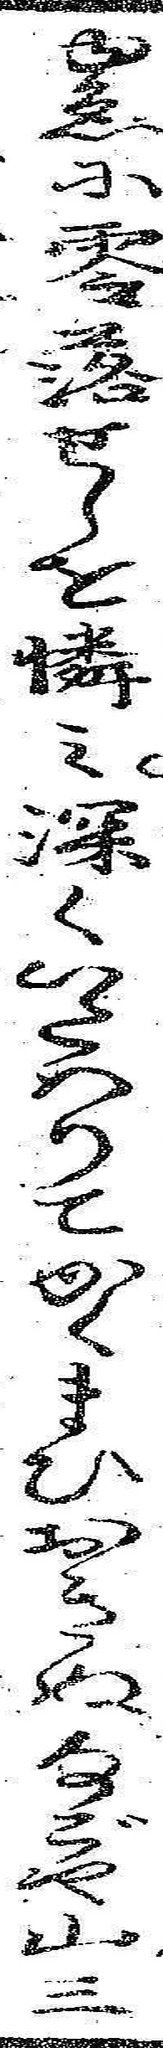ゆゑに零落せしを憐み。深くいたはりてかくまひおきぬ。なごや山三
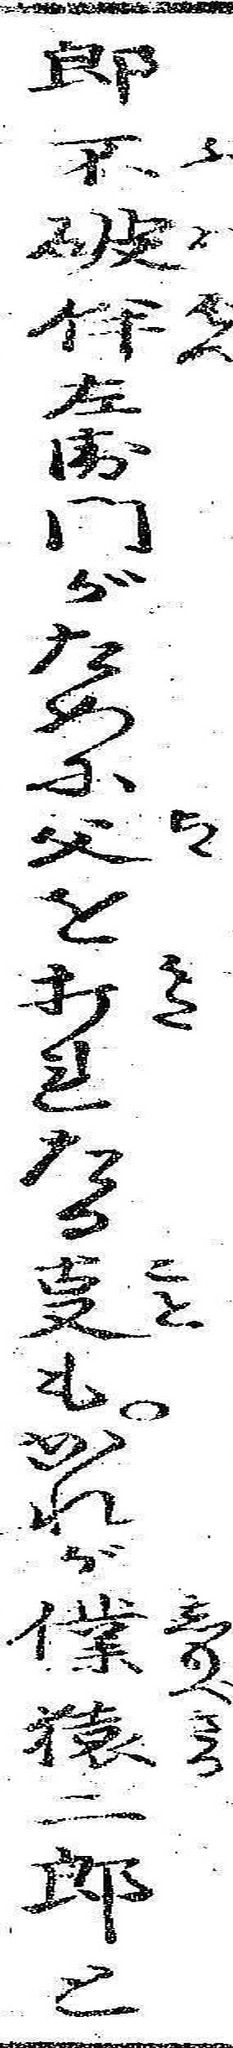郎不破伴左衛門がために父を打れたる事も。かれが僕猿二郎と
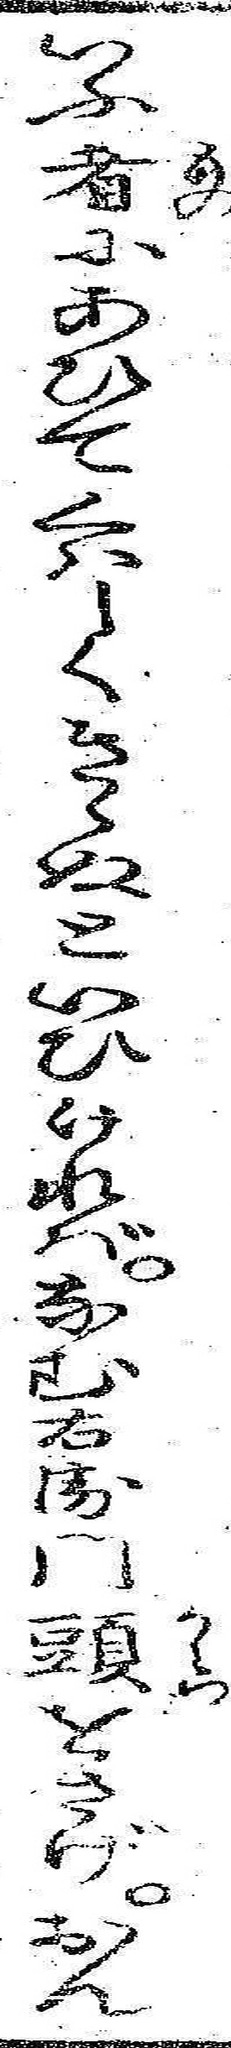いふ者にあひてくはしくきゝぬといひければ。なむ右衛門頭をさげ。おん
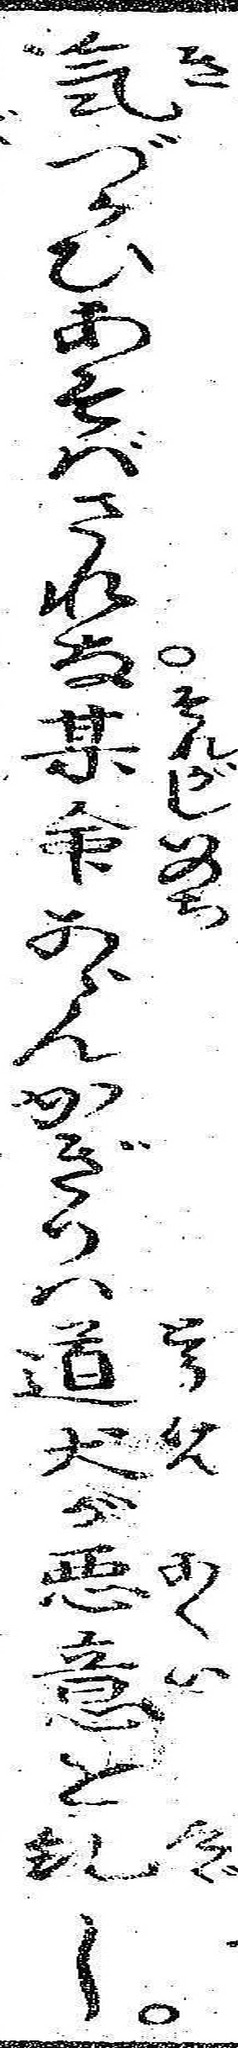気づかひあそばされな。某命あらんかぎりは道犬が悪意を糺し。
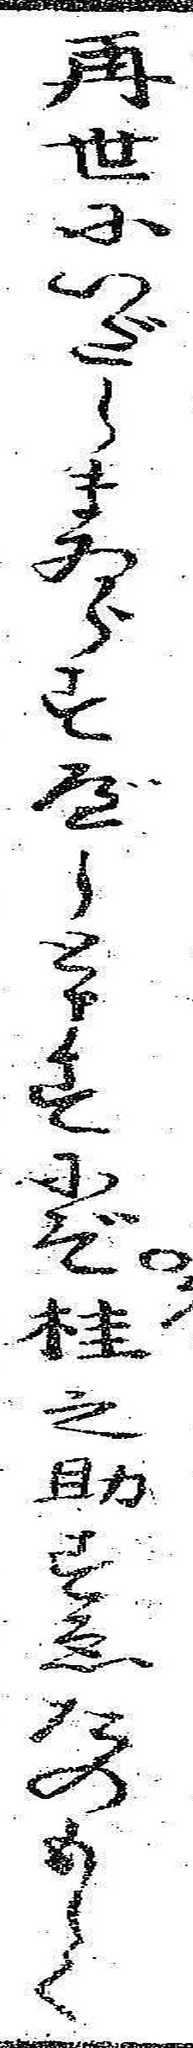再世にいだしまゐらすべしと申すにぞ。桂之助すゑたのもしく
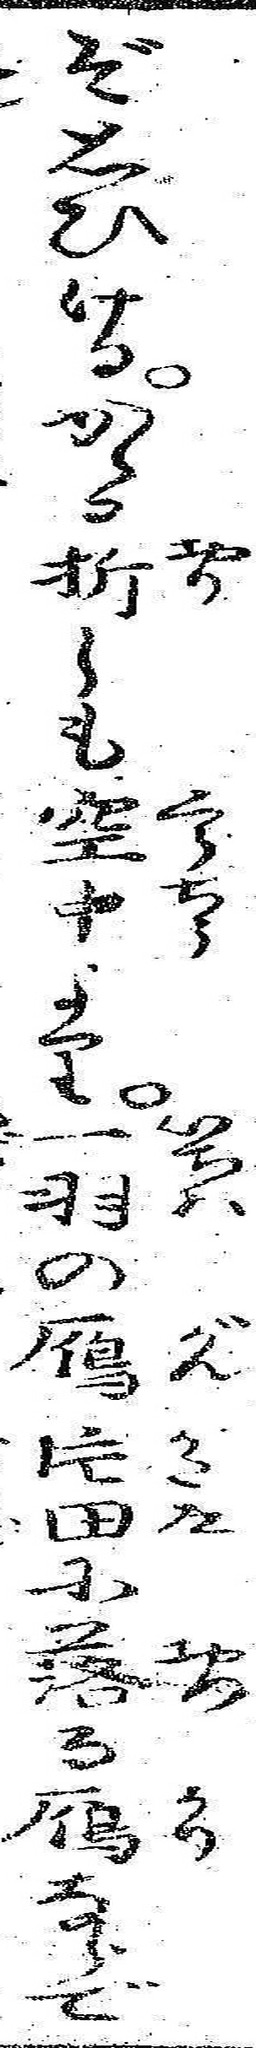ぞ思ひける。かゝる折しも空中より。一羽の雁片田に落る雁ならで
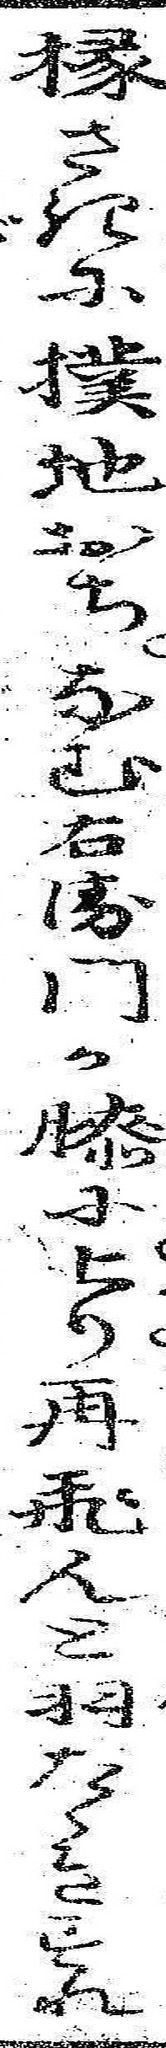椽さきに撲地おち。なむ右衛門か膝に上り。再飛んと羽たゝきすれ
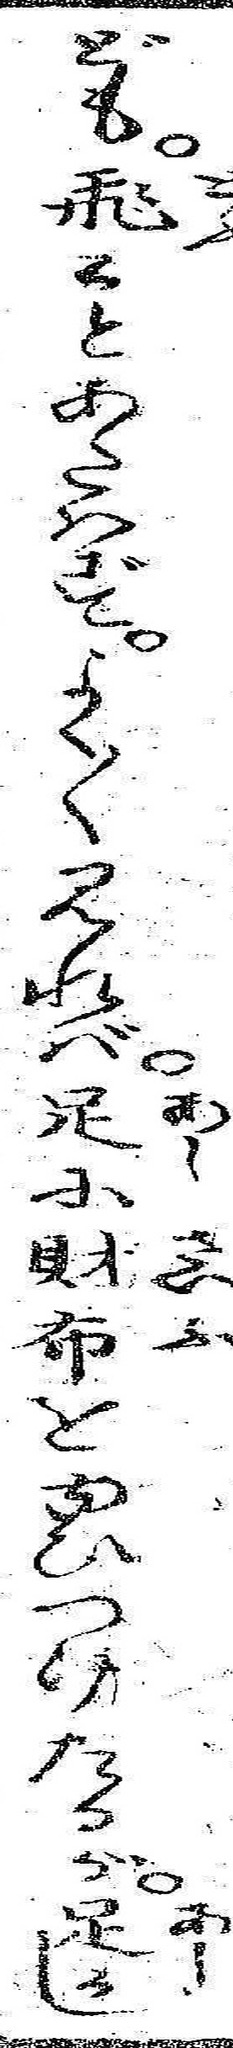ども。飛ことあたはず。よく〳〵見れば。足に財布をゆひつけたるが。足かし

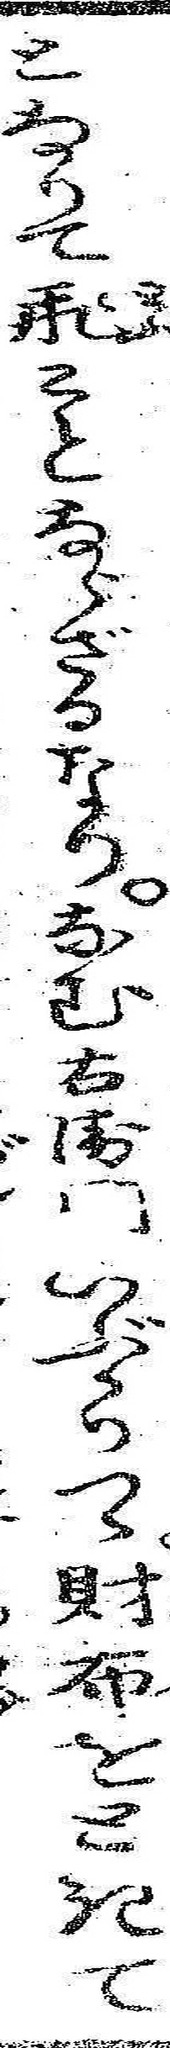となりて飛ことならざるなり。なむ右衛門いぶかりつゝ。財布をときて
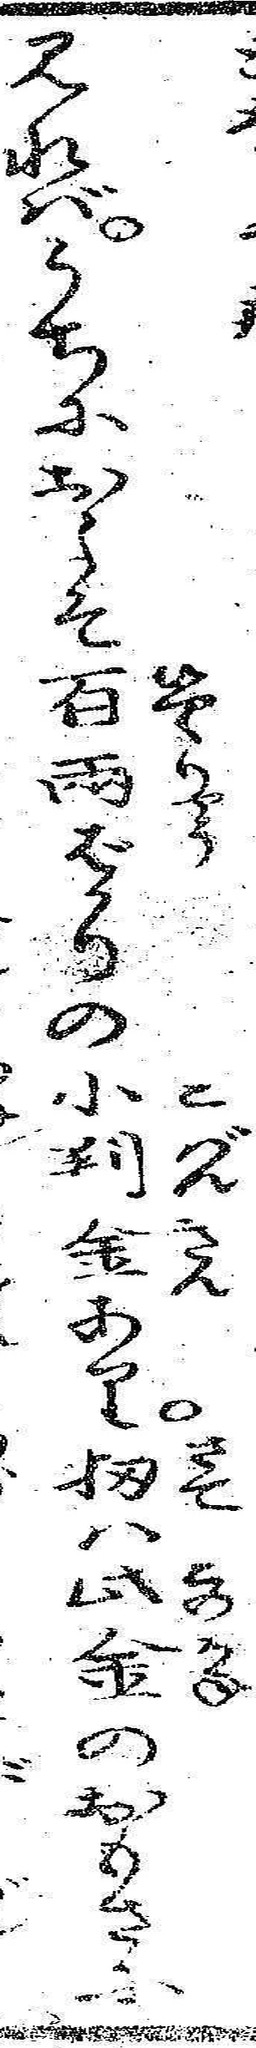見れば。うちにおよそ百両ばかりの小判金あり。扨は此金のおもさに
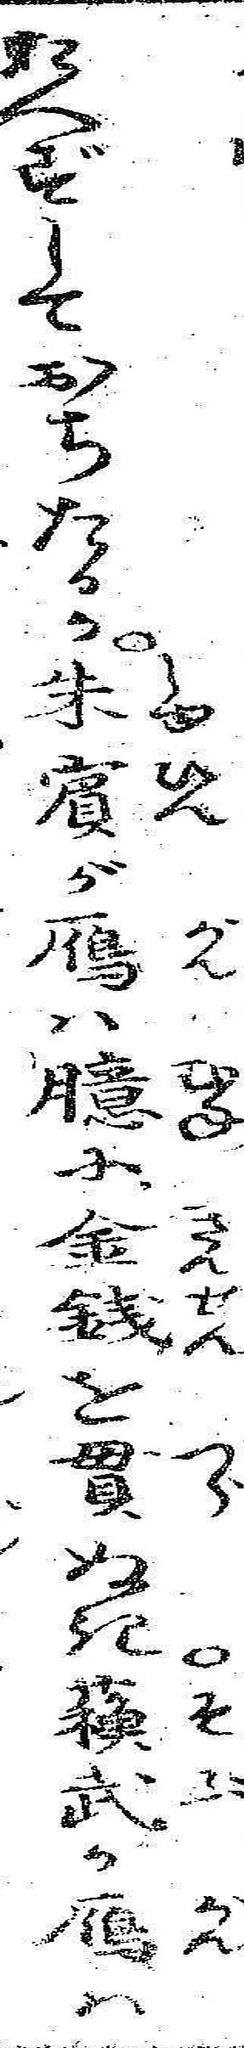たへずしておちたるか。朱賓が雁は臆に金銭を貫ぬき。蘇武か雁は
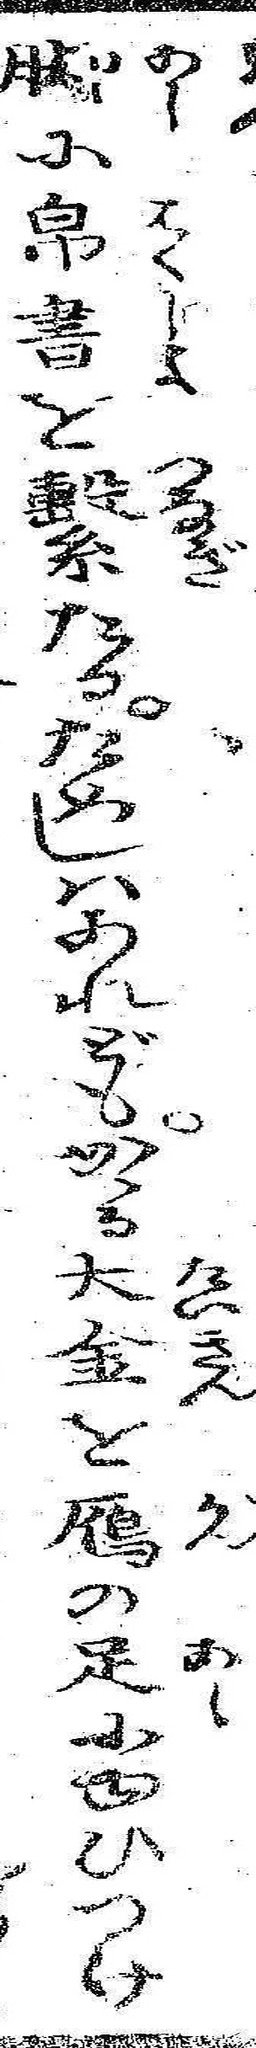脚に帛書を繋たる。ためしはあれども。かゝる大金を雁の足にゆひつけ
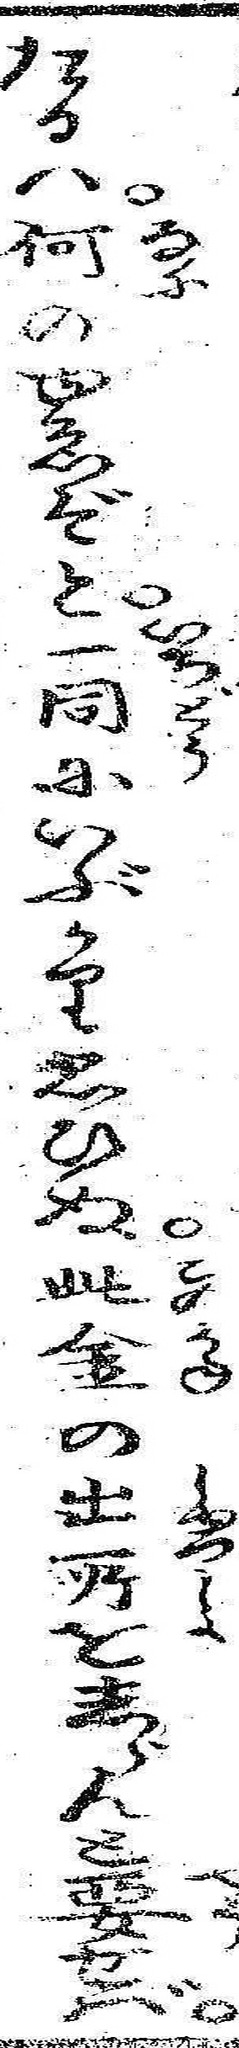たるは。何のゆゑぞと。一同にいぶかり思ひぬ。此金の出所をしらんと要せば。
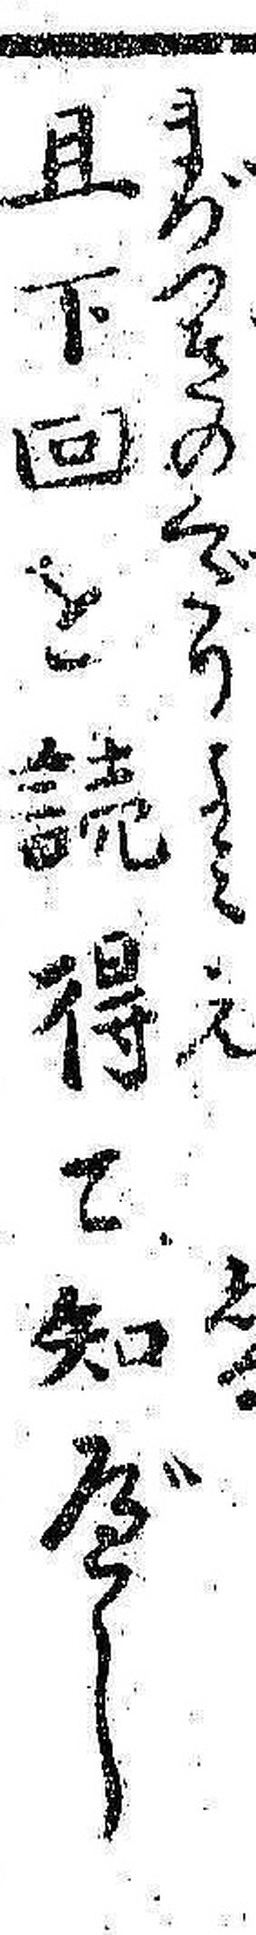且下回を読得て知べし

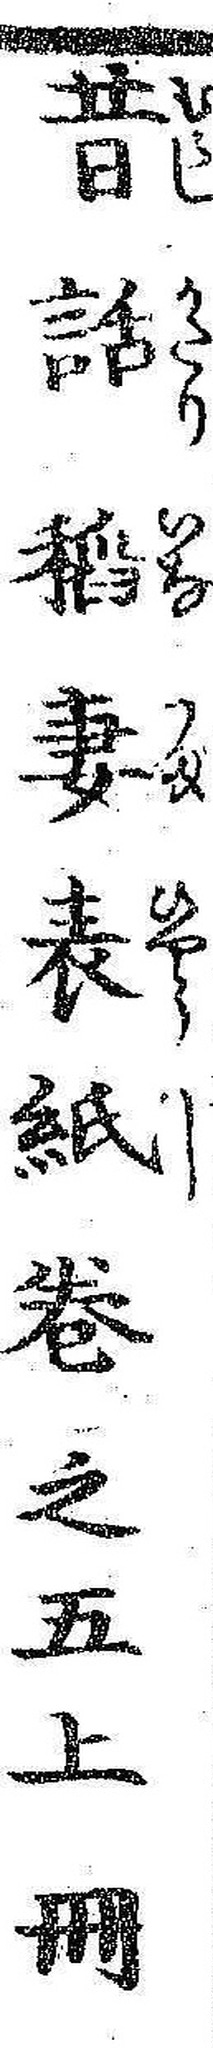昔話稲妻表紙巻之五上冊
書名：昔話稲妻表紙
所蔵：国文学研究資料館
